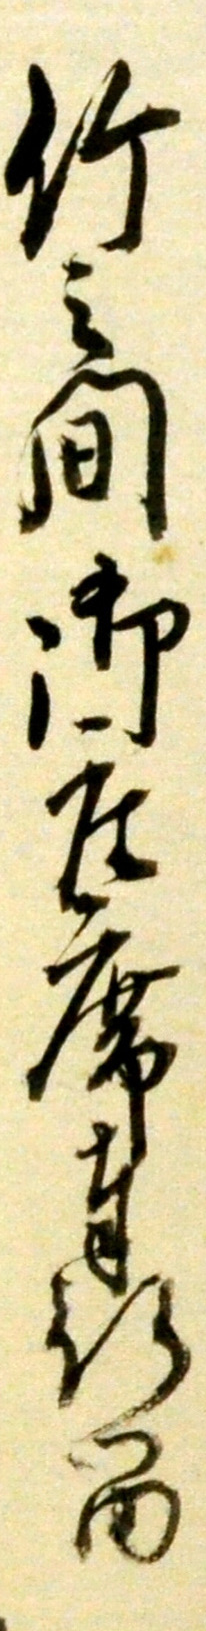竹之間御座席奉行留
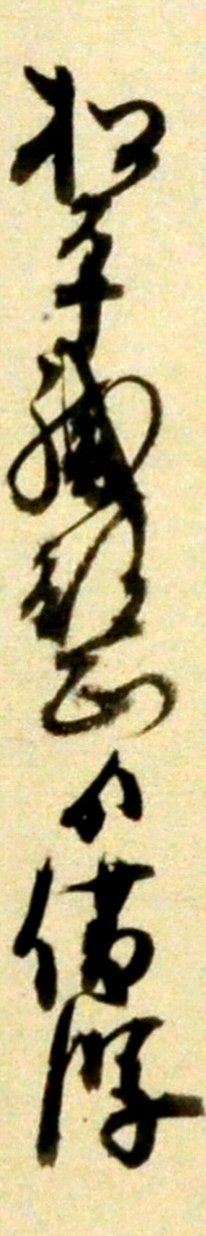松平織部正ゟ借寫
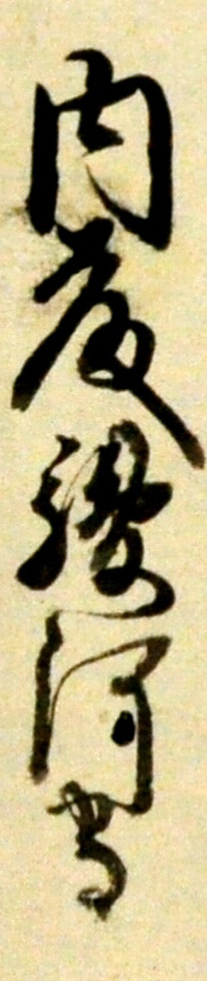内藤駿河守
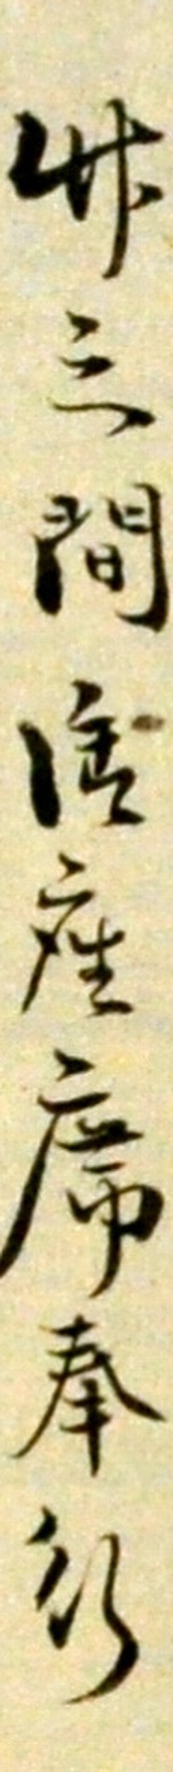竹之間御座席奉行
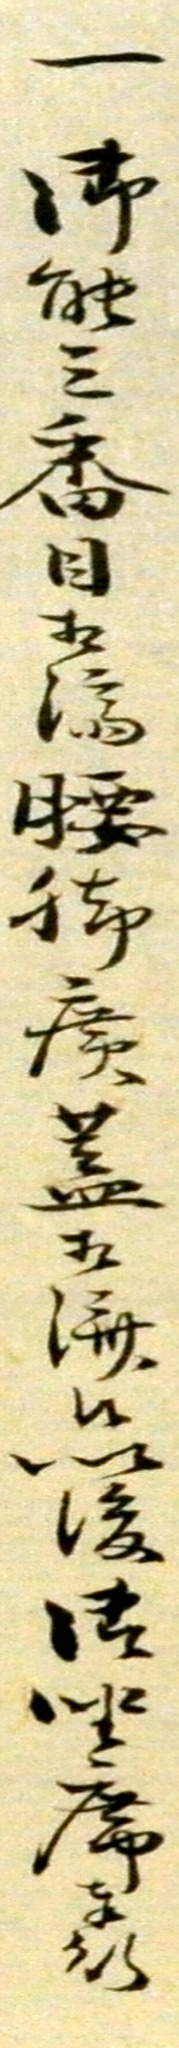一御能三番目相済腰脚廣蓋相済候以後御坐席奉行
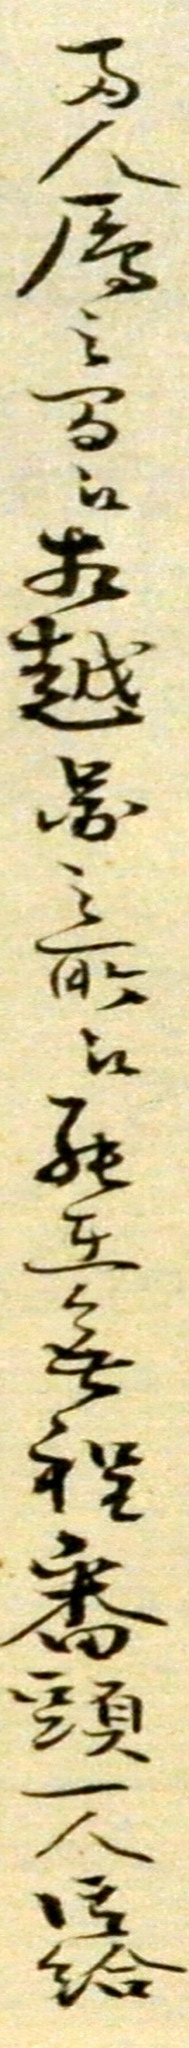両人雁之間え相越圖之所え罷在無程番頭一人御給
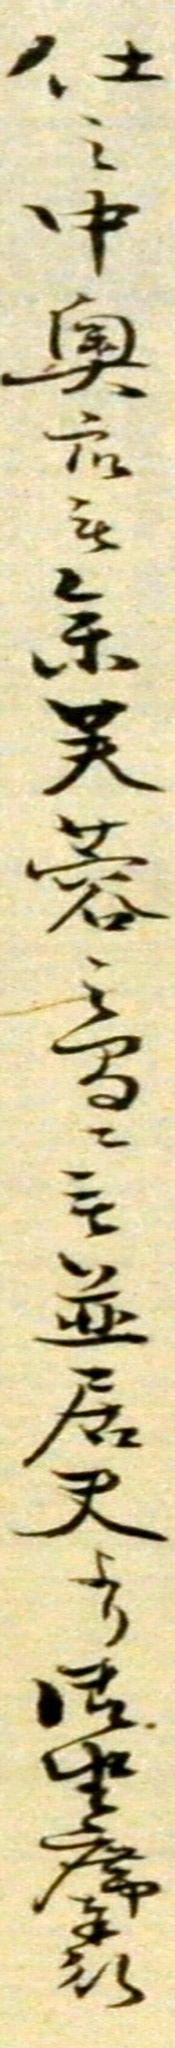仕之中奥衆被参芙蓉之間ニ被並居夫より御坐席奉行
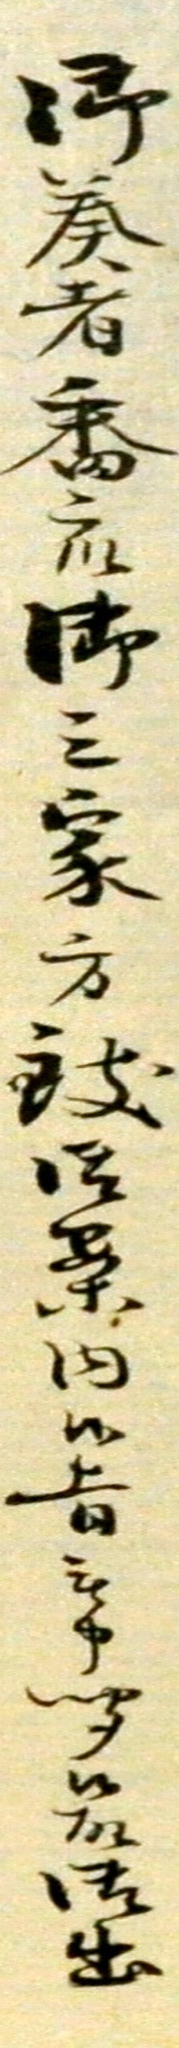御奏者番衆御三家方致御案内候旨被申聞候故御出
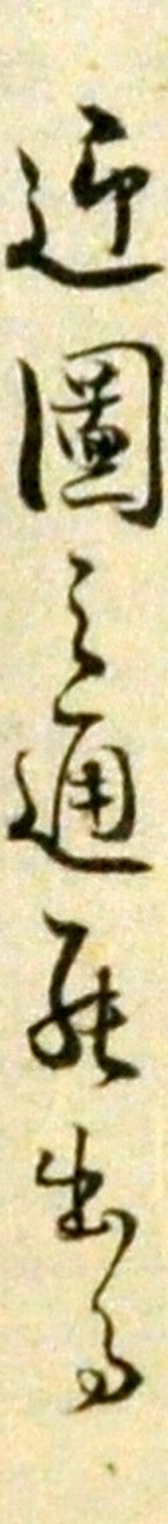迎圖之通罷出事
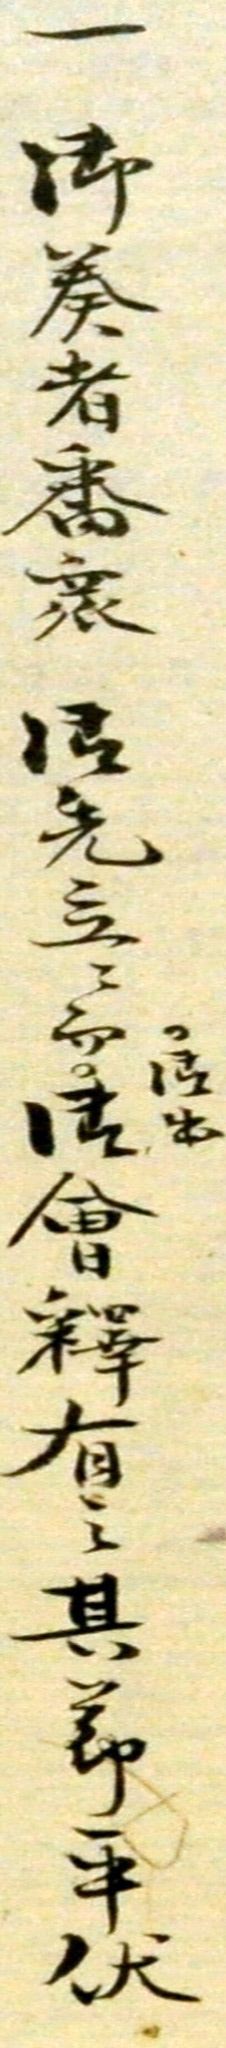一御奏者番衆御先立ニ而◦御會釋有之其節平伏
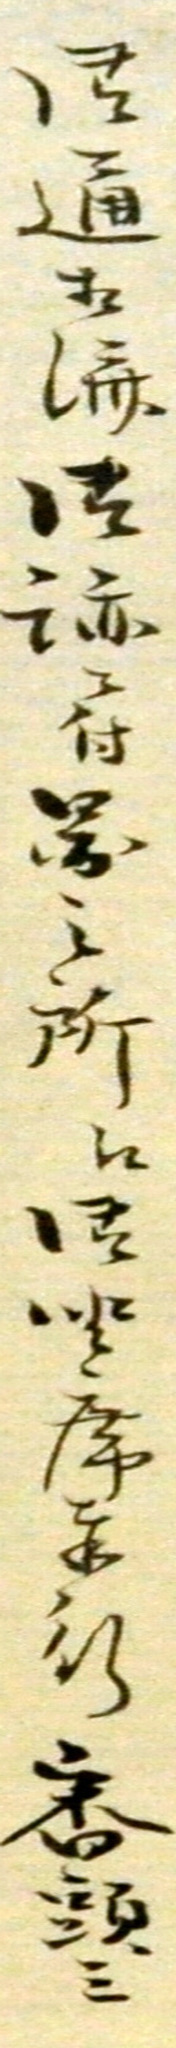御通相済御跡ニ付圖之所え御坐席奉行番頭三
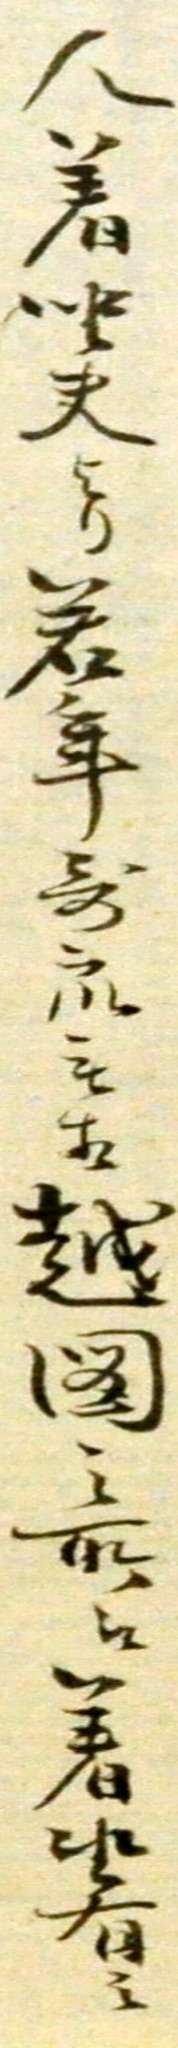人着坐夫より若年寄衆被相越圖之所え着坐有之
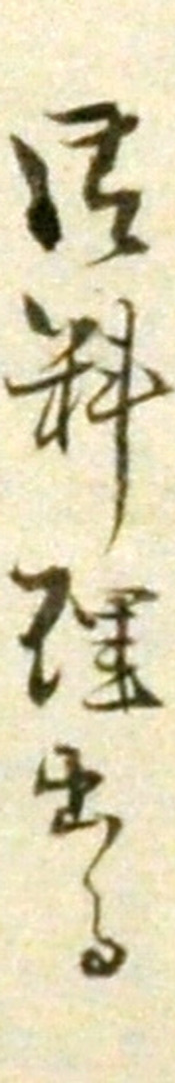御料理出る
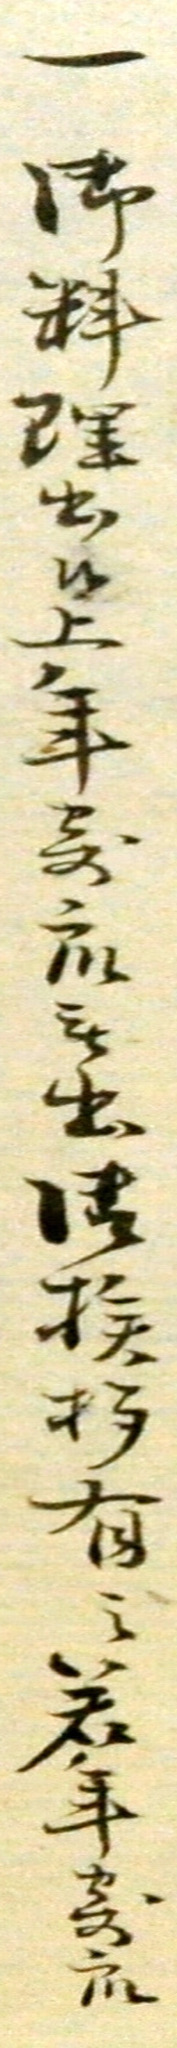一御料理出候上年寄衆被出御挨拶有之若年寄衆
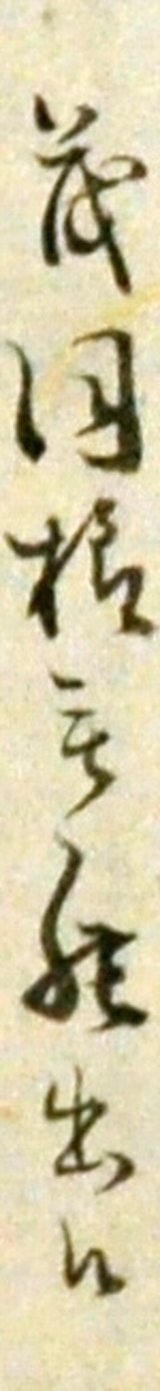も同様被罷出候

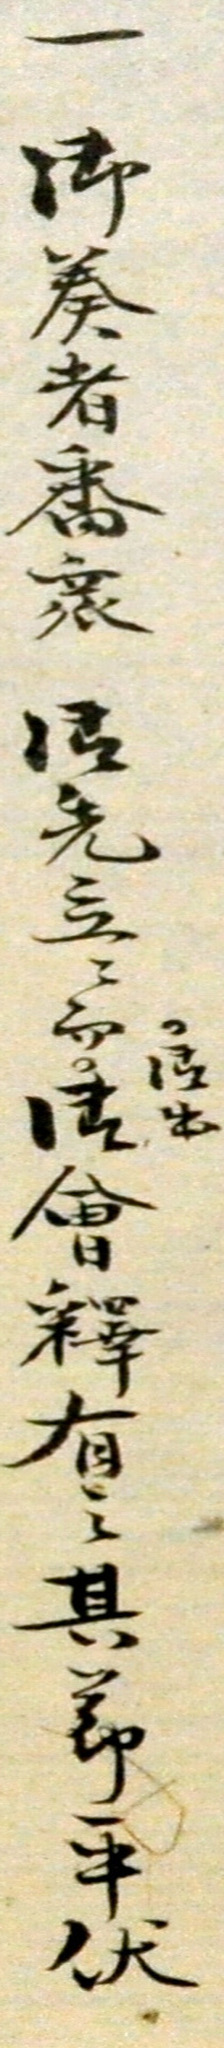一御奏者番衆御先立ニ而◦御會釋有之其節平伏
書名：竹ノ間御座席奉行勤方控外
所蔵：伊那市立高遠町図書館・合同会社AMANE
